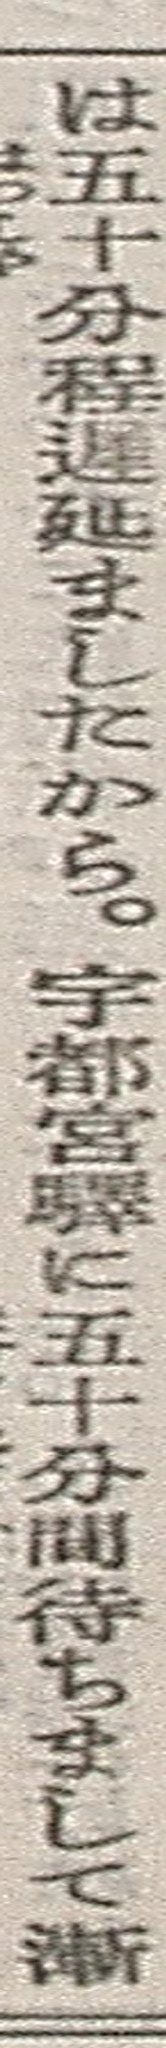は五十分程遅延ましたから。宇都宮駅に五十分間待ちまして漸
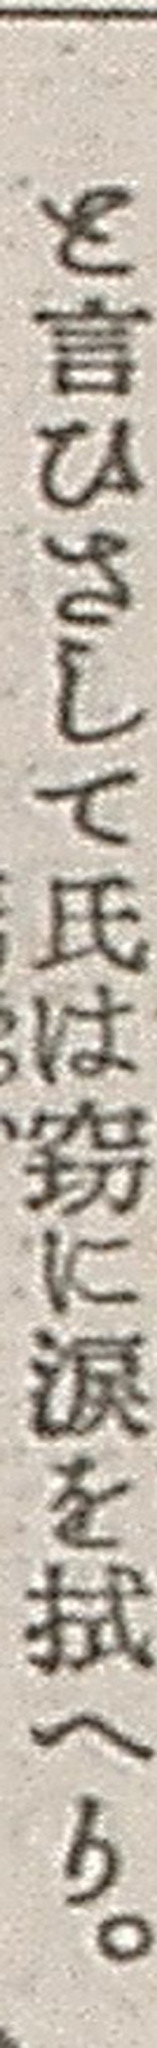と言ひさして氏は窃に涙を拭へり。
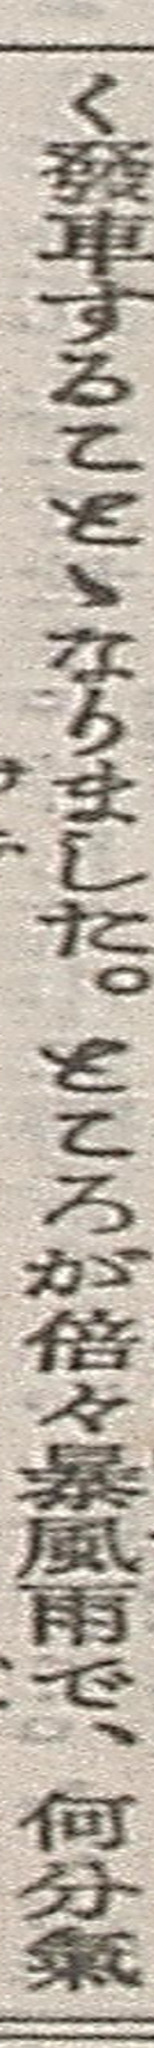く発車することゝなりました。ところが倍々暴風雨で、何分気
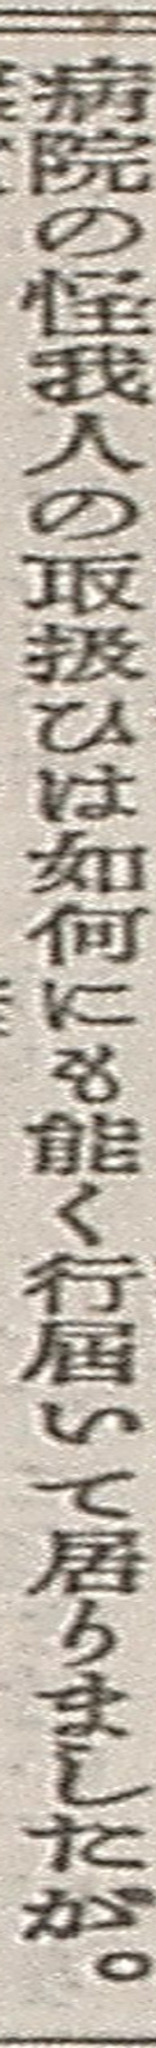病院の怪我人の取扱ひは如何にも能く行届いて居りましたが。
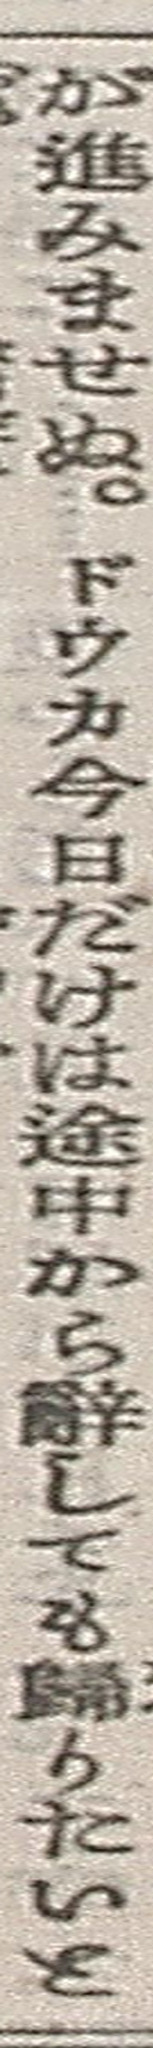が進みませぬ。ドウカ今日だけは途中から辞しても帰りたいと
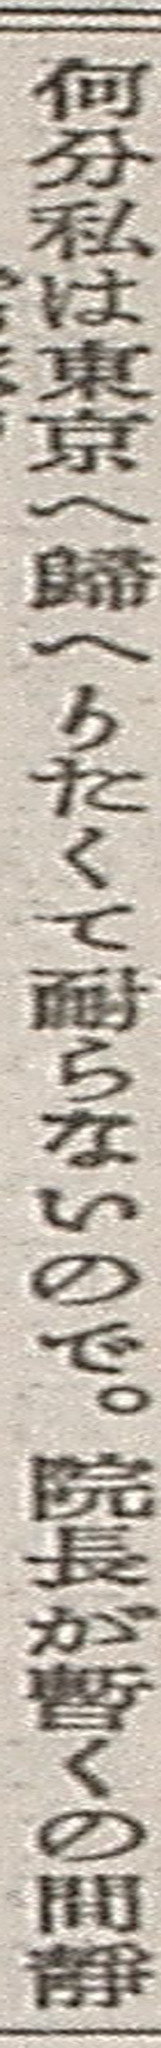何分私は東京へ帰へりたくて耐らないので。院長が暫くの間静
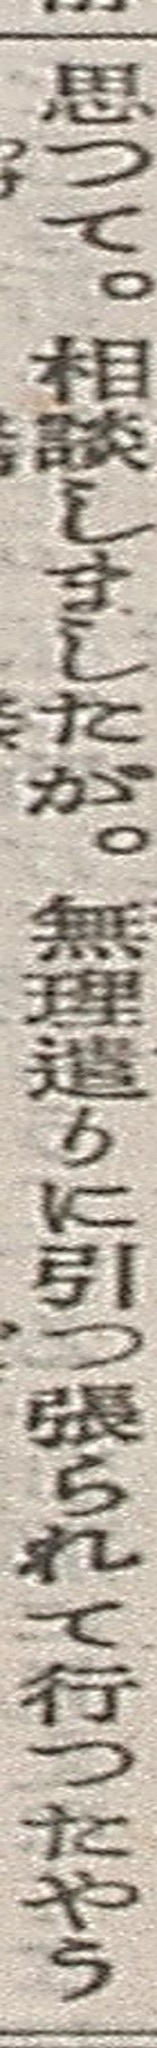思つて。相談しましたが。無理遣りに引つ張られて行つたやう
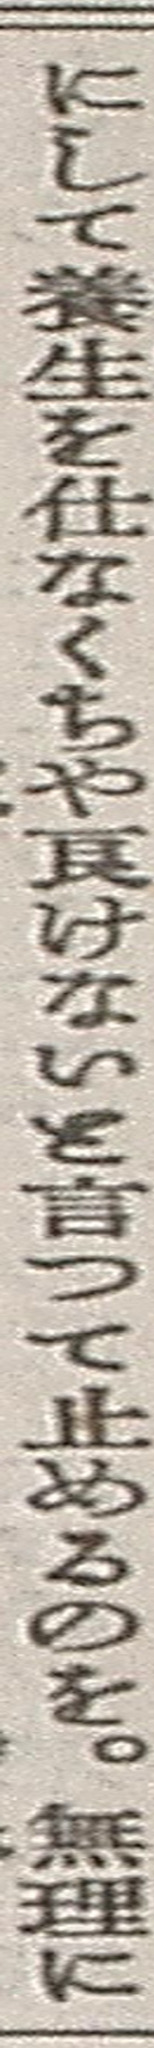にして養生を仕なくちや良けないと言つて止めるのを。無理に
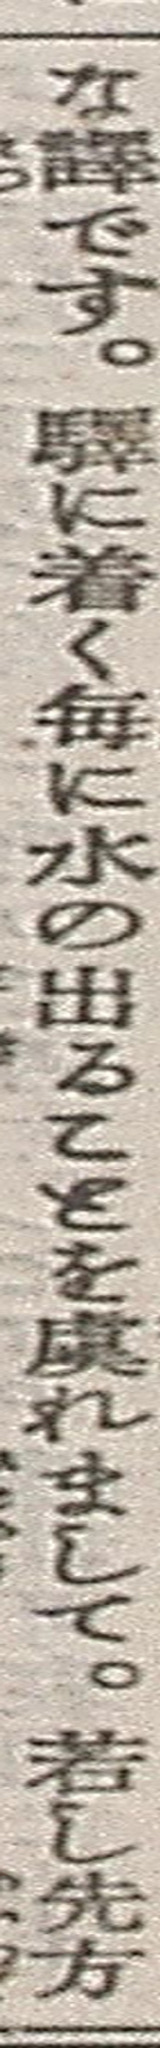な訳です。駅に着く毎に水の出ることを虞れまして。若し先方
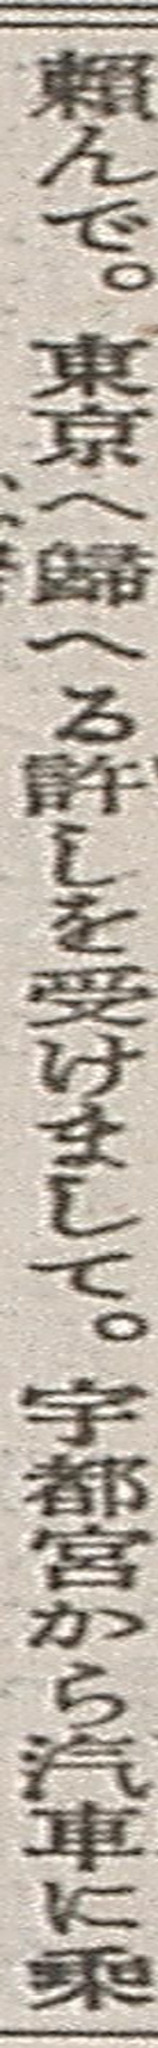頼んで。東京へ帰へる許しを受けまして。宇都宮から汽車に乗
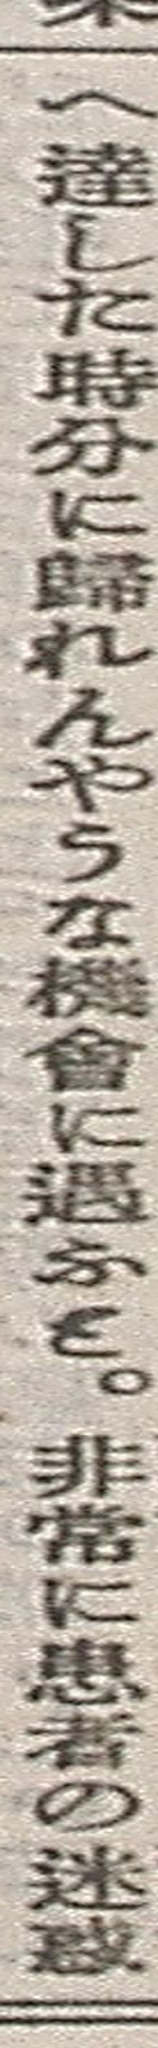へ達した時分に帰れんやうな機会に遇ふと。非常に患者の迷惑
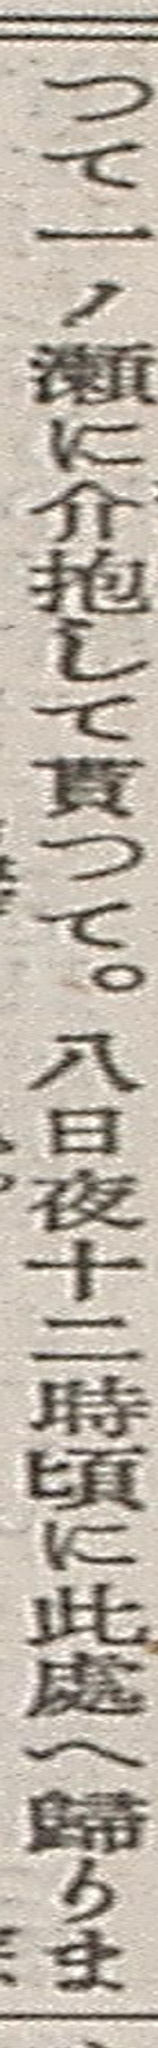つて一ノ瀬に介抱して貰つて。八日夜十二時頃に此処へ帰りま
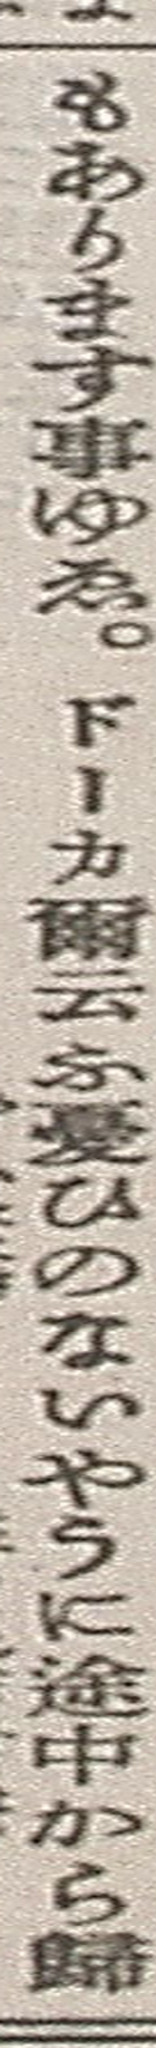もあります事ゆゑ。ドーカ爾云ふ憂ひのないやうに途中から帰
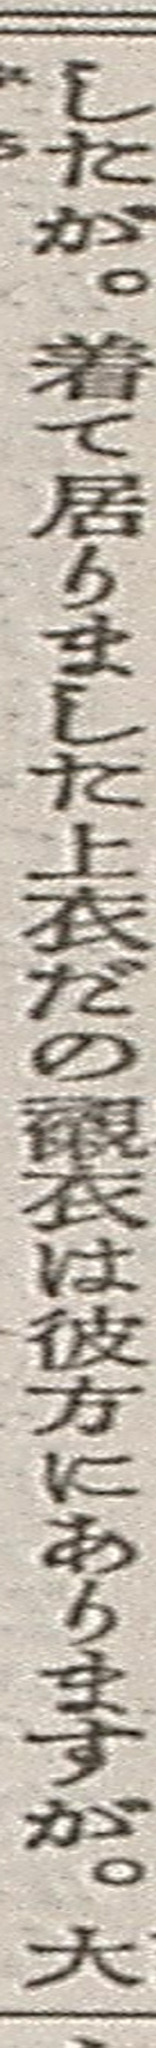したが。着て居りました上衣だの襯衣は彼方にありますが。大
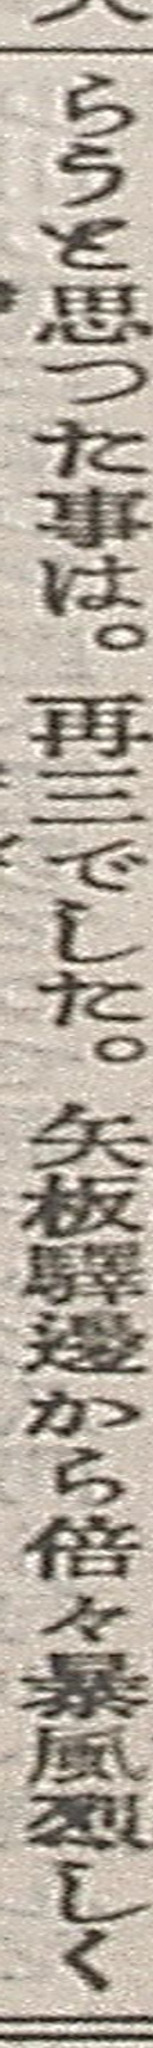らうと思つた事は。再三でした。矢板駅辺から倍々暴風烈しく
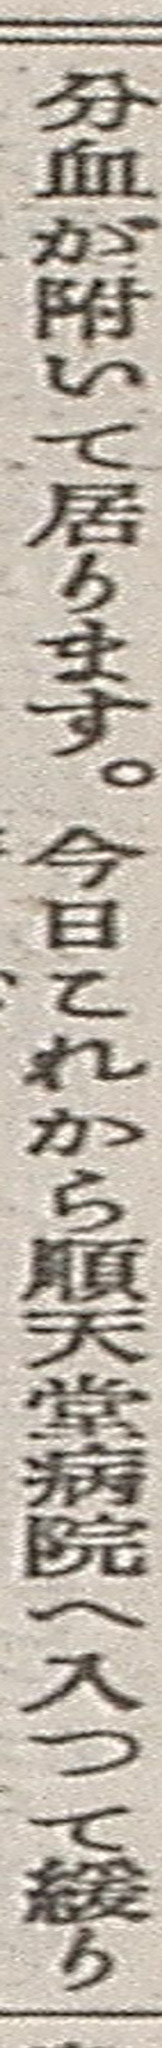分血が付いて居ります。今日これから順天堂病院へ入つて緩り
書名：風俗畫報臨時増刊第百九十九號　明治三十二年十月各地災害圖會（前編之續）
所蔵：東京大学地震研究所図書室 Earthquake Research Institute Library, The University of Tokyo, JAPAN
